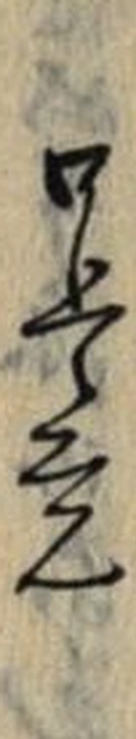口上之覚
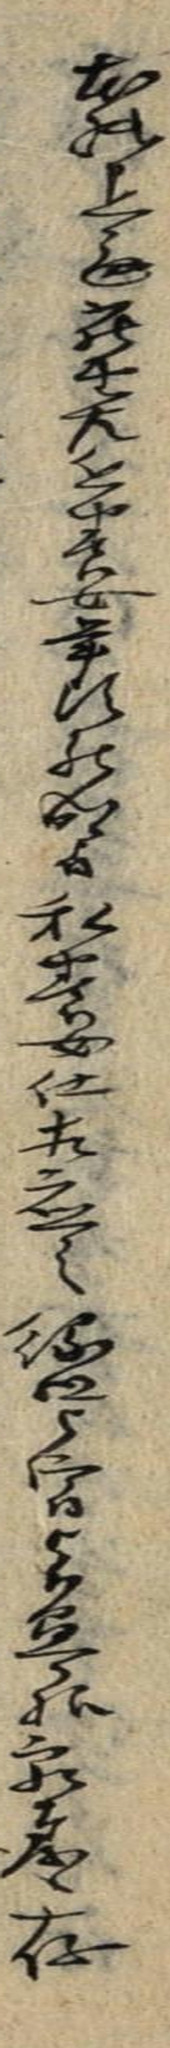本紙申上候通荻野左近養女年頃相成候ニ付私養女仕相応之縁組被仰付被下置候様願奉存候存
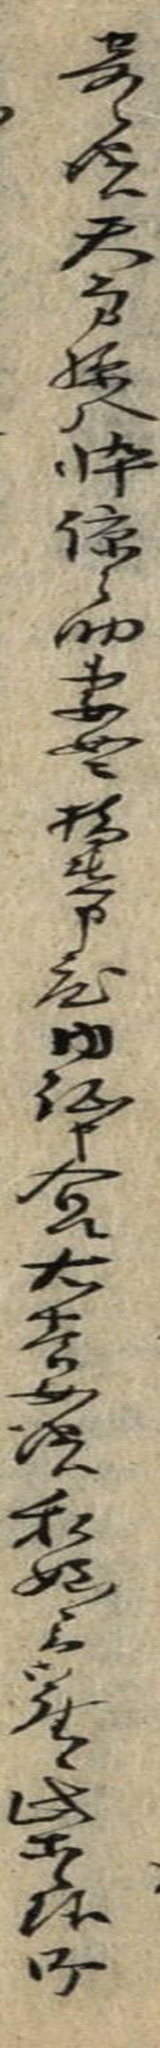寄候儀天方孫八郎悴諒之助妻女ニ指遣申度内証申合候右養女儀ハ私姪ニ而御座候此等之趣御
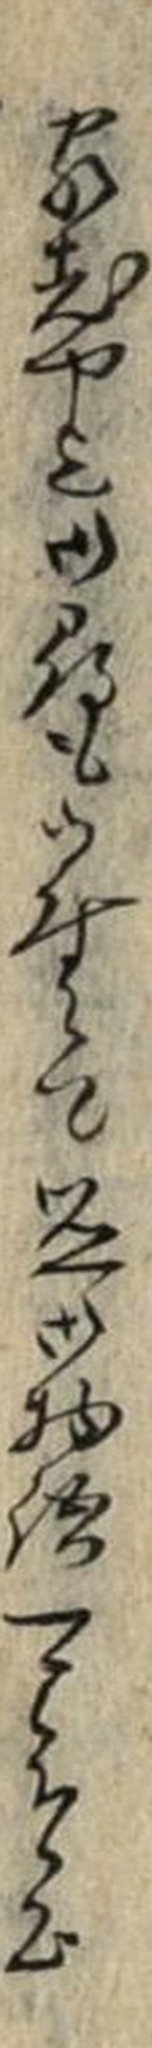家老中迄御尋も御座候ハヽ宜御物語可被下候以上
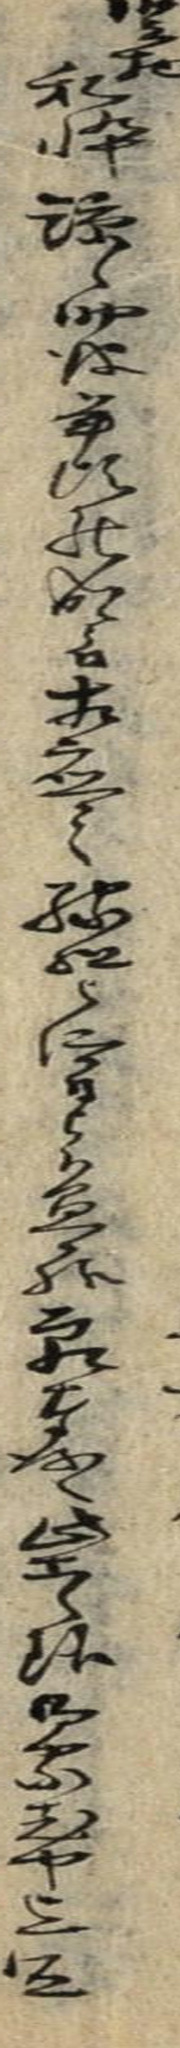私悴諒之助儀年頃罷成候ニ付相応之縁組被仰付被下置候様願奉存候此等之趣御家老中迄宜
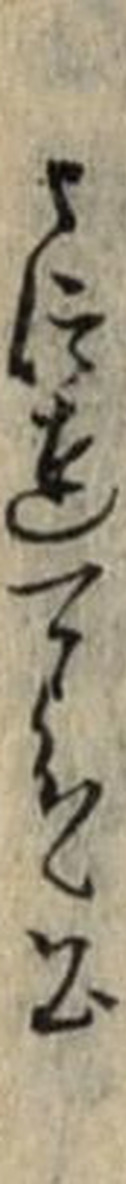被仰達可被下候以上
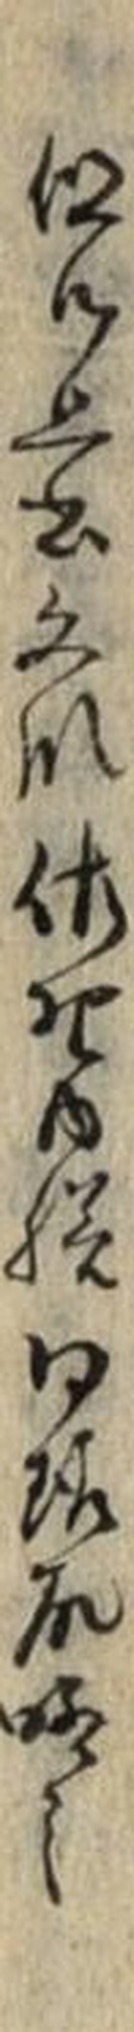但口上書文段佐野内膳同趣故略之
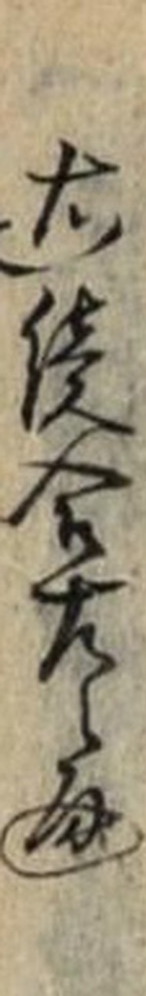右続合左之通
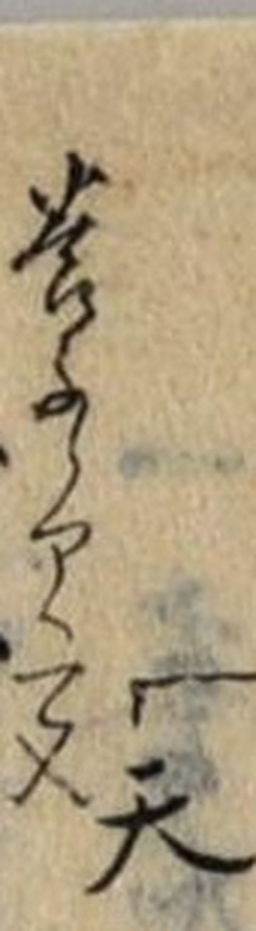養子之部へ可入
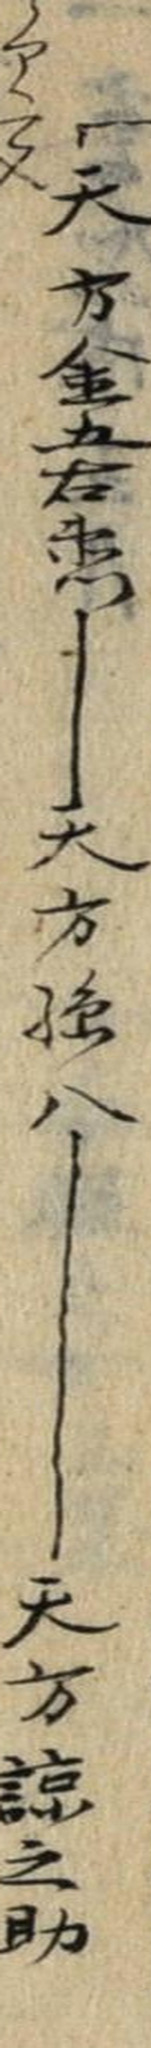天方金五右衛門天方孫八天方諒之助
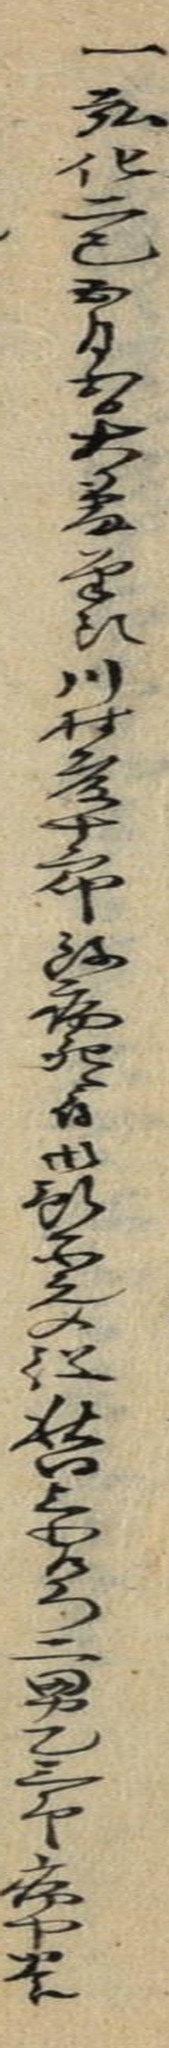一弘化二巳五月五日大御番筆頭川村藤十郎致病死候ニ付御預所元〆役秋田三五左衛門二男乙三郎病中養
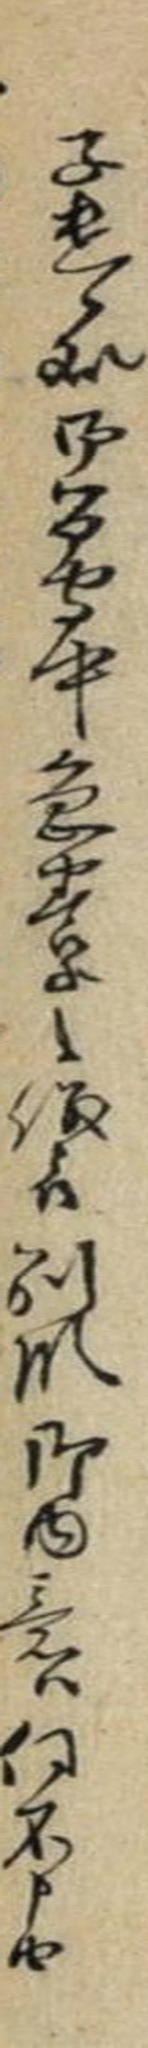子遣候処御留守中急養子之儀ニ付別段御内意ハ伺不申由
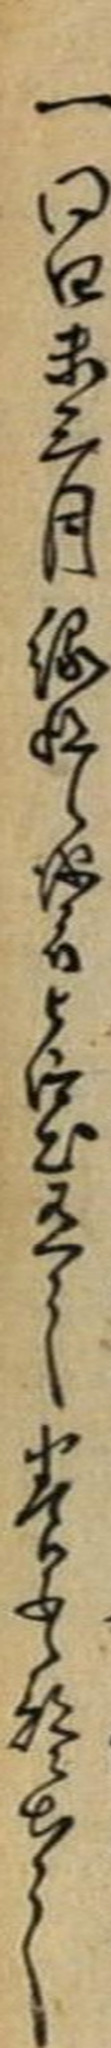一同四未三月縁組之儀ニ付被仰出有之養子之部ニ出之
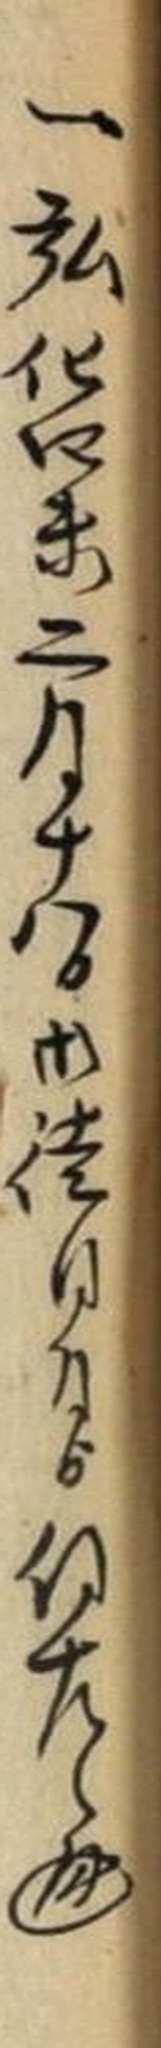一弘化四未ニ月十八日御徒目付ゟ伺左之通
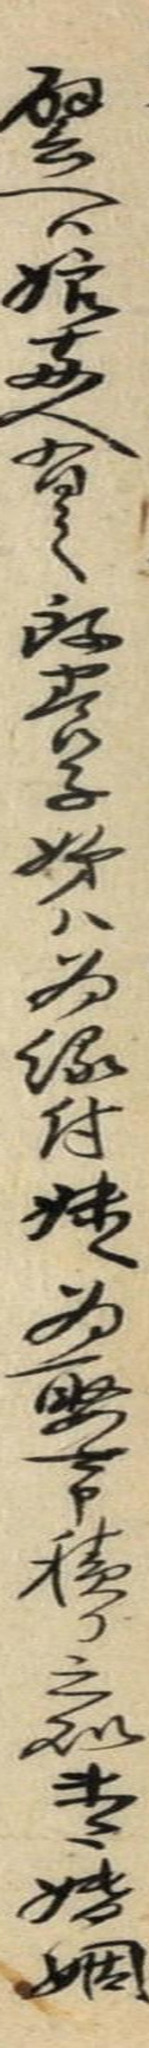譬へハ娘両人有之致養子姉ハ為縁付妹へ為娶可申積り之処未た婚姻
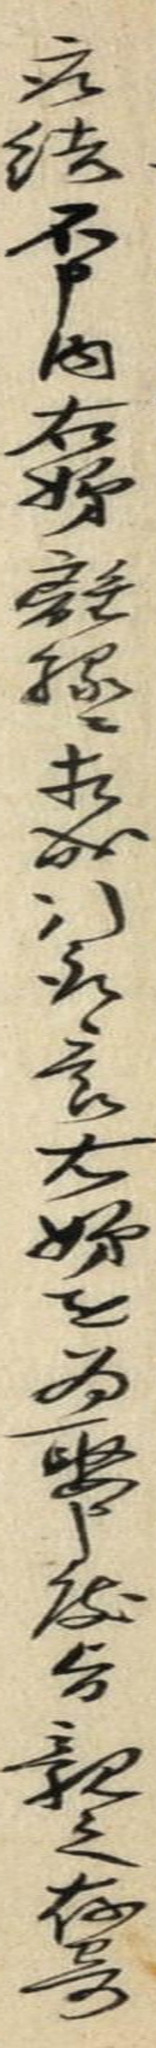取結不申内右姉離縁ニ相成引取候節右姉を為娶申度旨親之存寄
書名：養子縁組之部
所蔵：福井県文書館 Fukui Prefectural Archives
